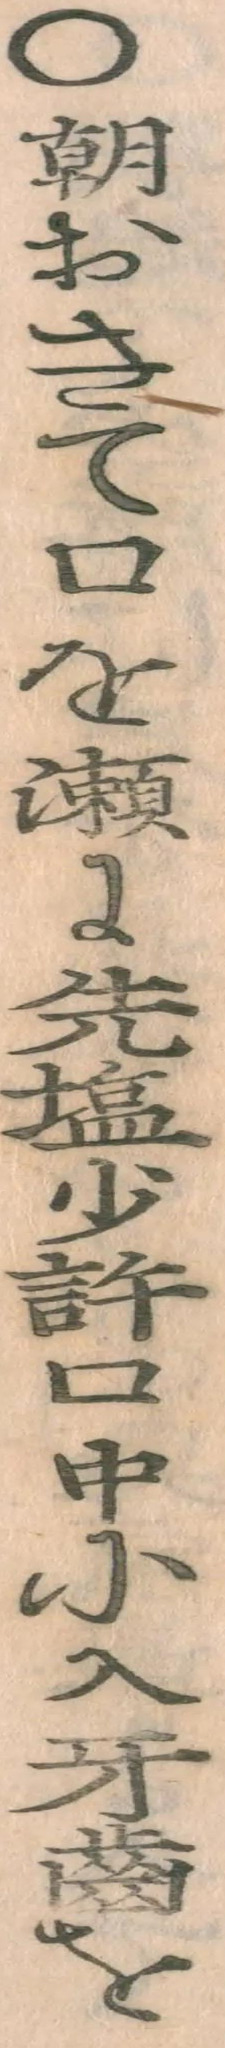〇朝おきて口を瀬に先塩少許口中に入牙歯を
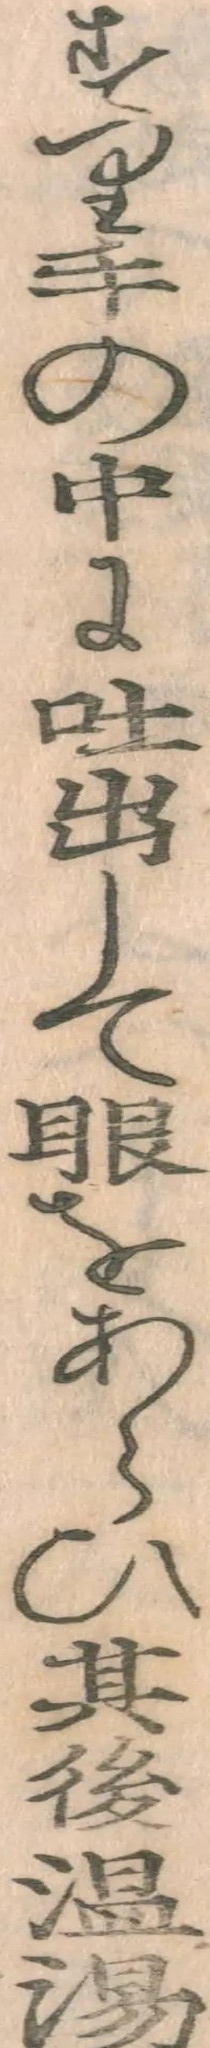すり手の中に吐出して眼をあらひ其後温湯
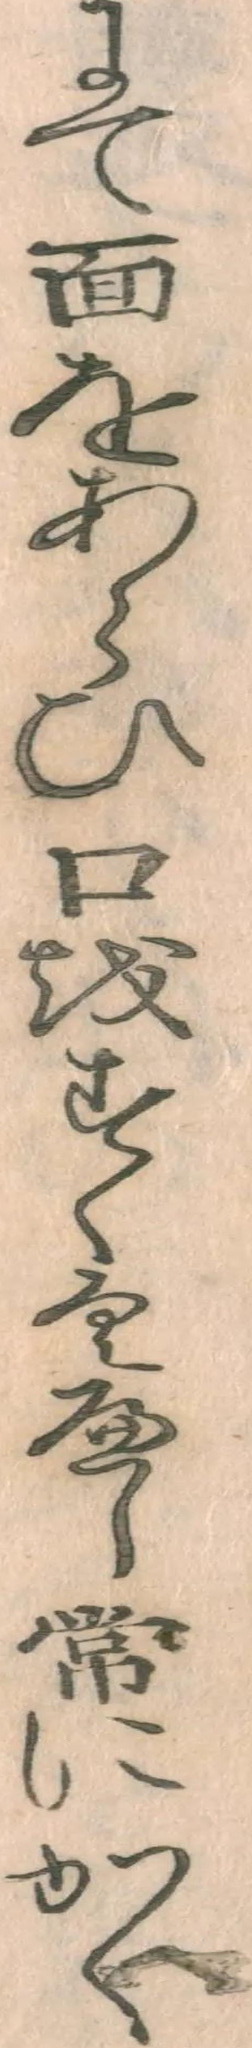にて面をあらひ口をすゝくへし常にかく
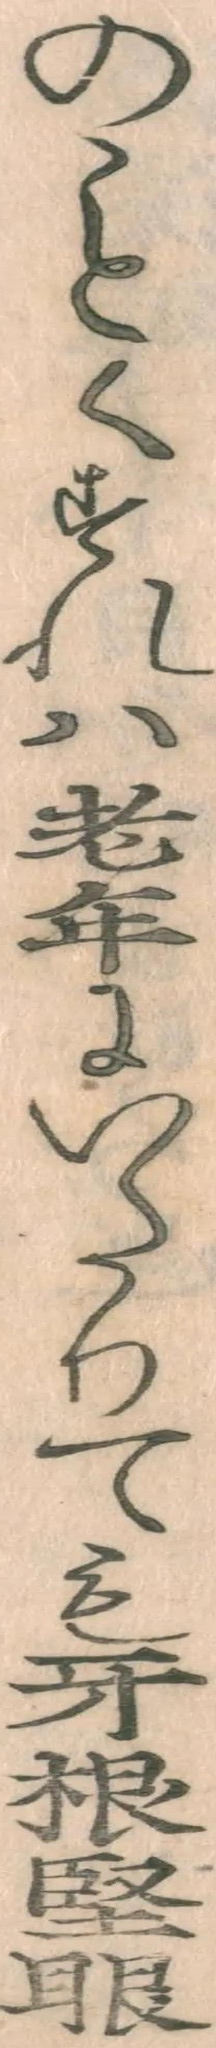のことくすれは老年にいたりても牙根堅眼
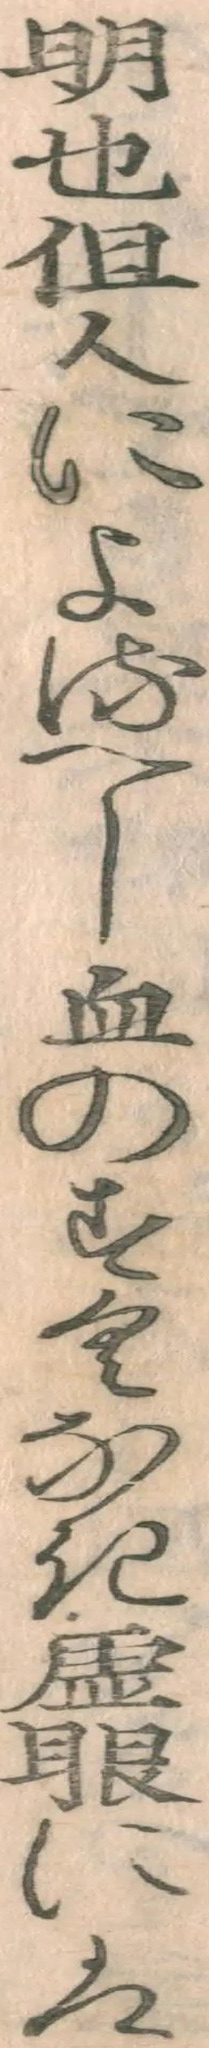明也但人によるへし血のすくなき虚眼には
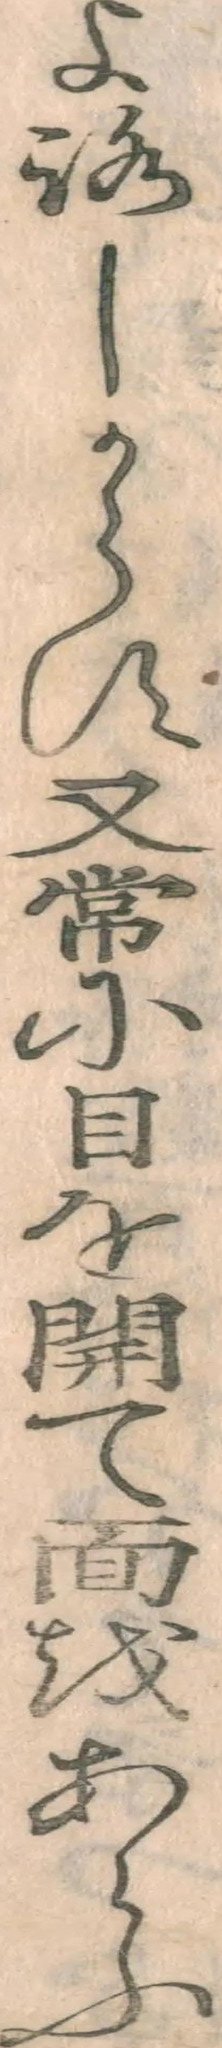よろしからす又常に目を開て面をあらふ
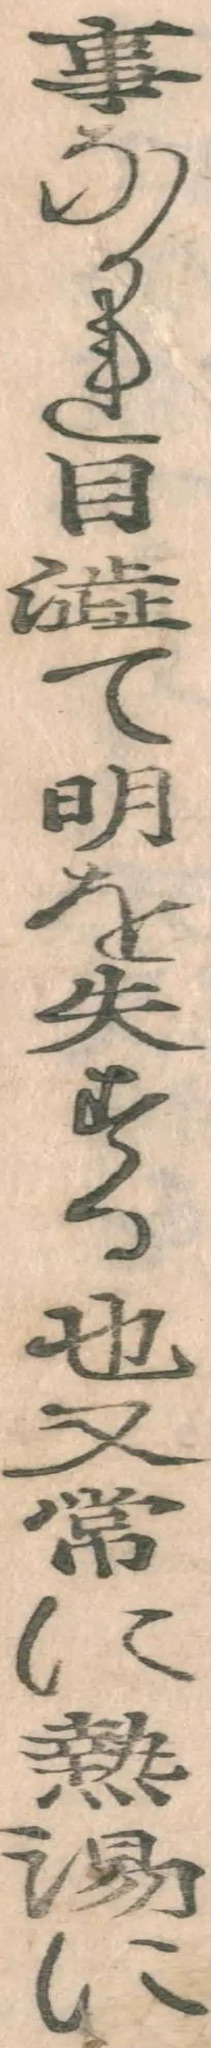事なかれ目渋て明を失する也又常に熱湯に

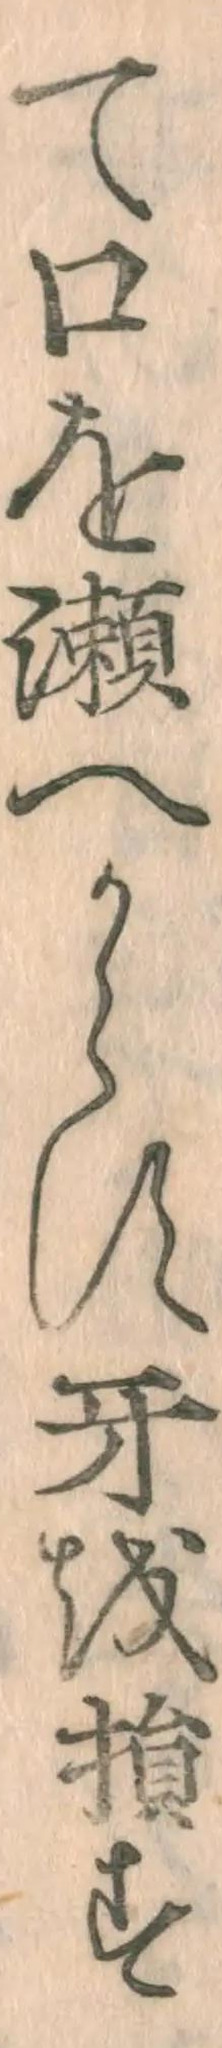て口を瀬へからす牙を損す
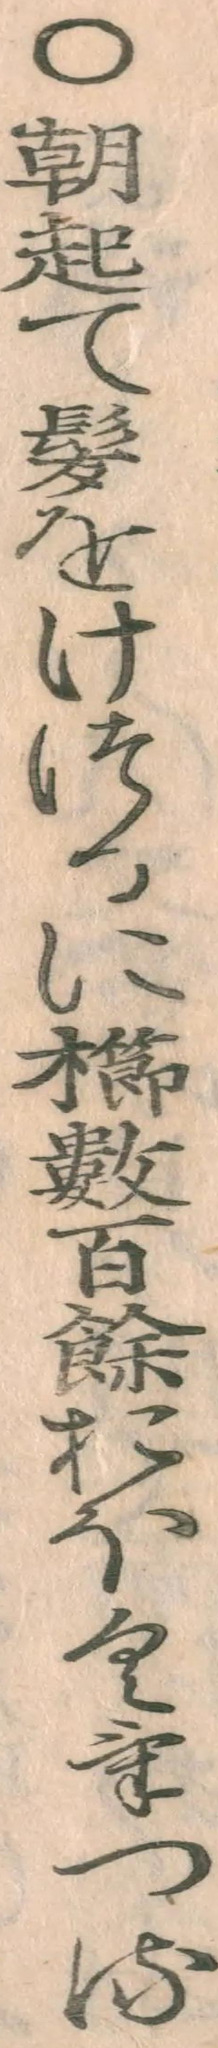〇朝起て髪をけつるに櫛数百余おほくけつる
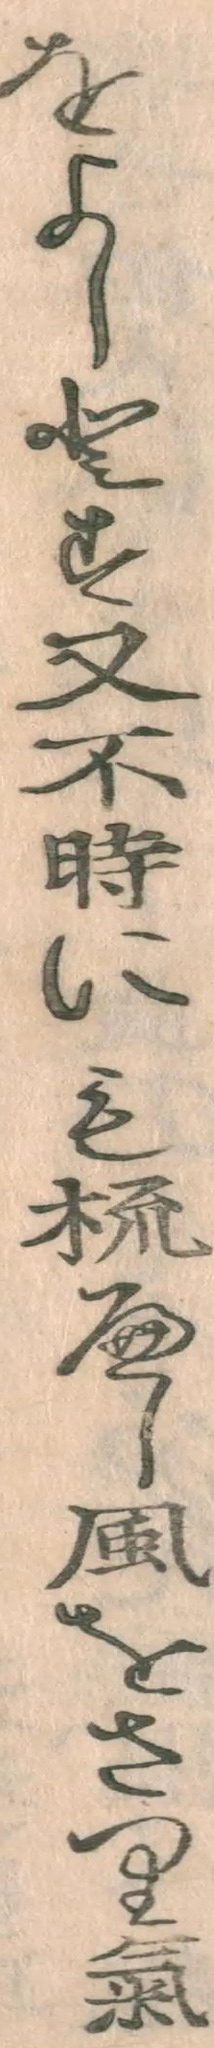をよしとす又不時にも梳へし風をさり気
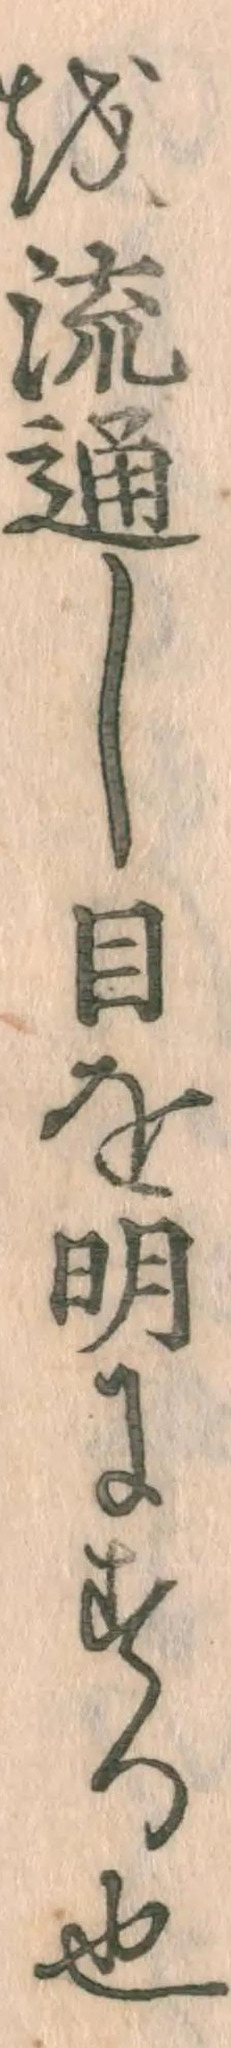を流通し目を明にする也
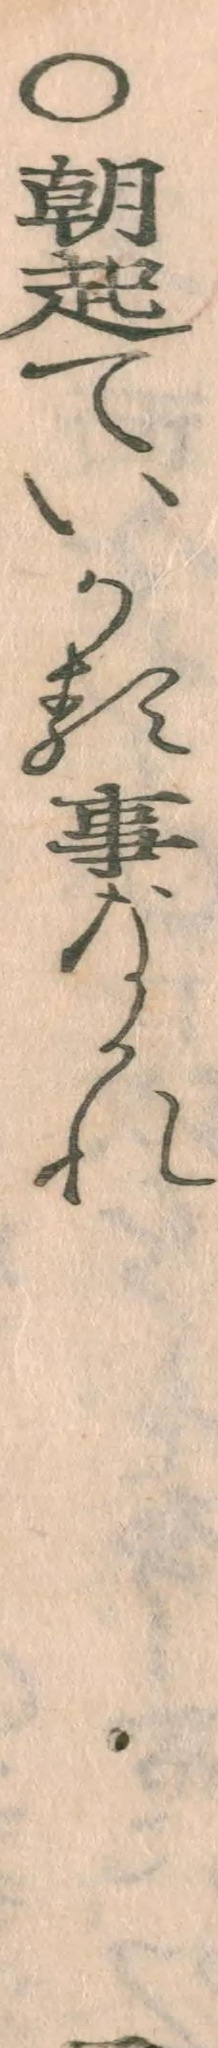〇朝起ていかる事なかれ
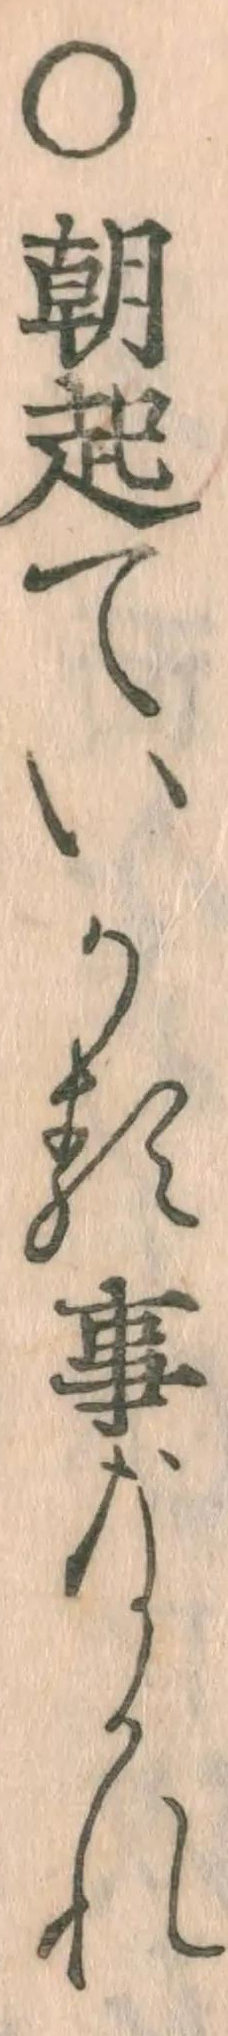〇朝起ていかる事なかれ
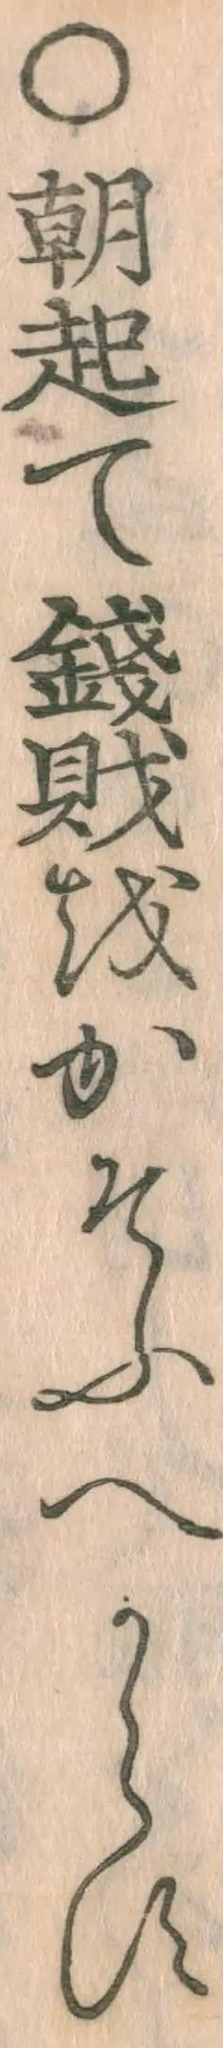〇朝起て錢財をかそふへからす
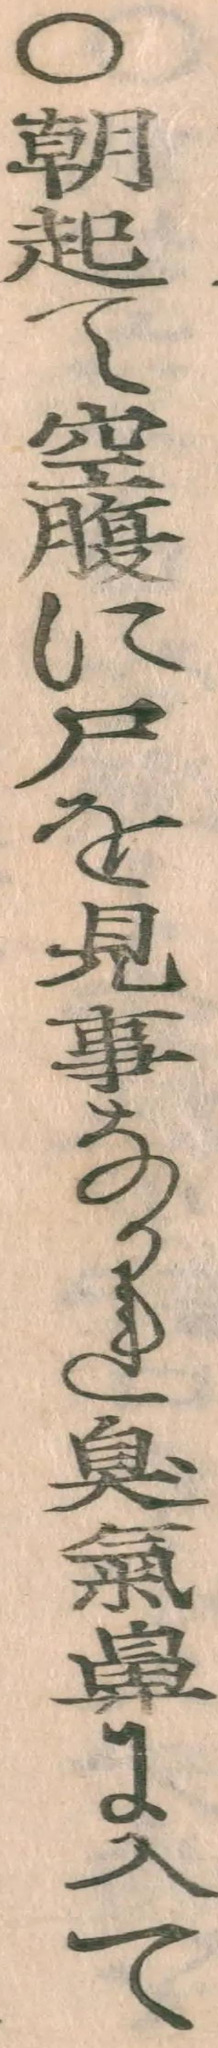〇朝起て空腹に尸を見事なかれ臭気鼻に入て
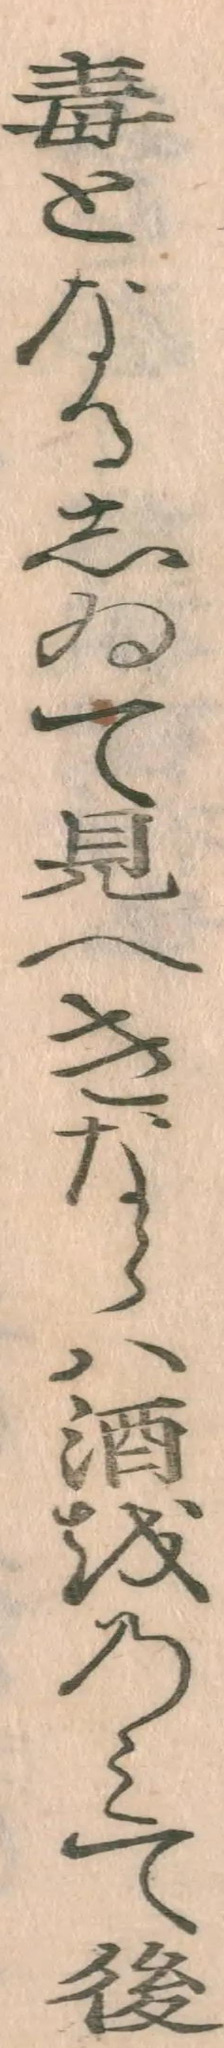毒となるしゐて見へきならは酒をのみて後
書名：延壽撮要
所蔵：国立国会図書館 National Diet Library, JAPAN
